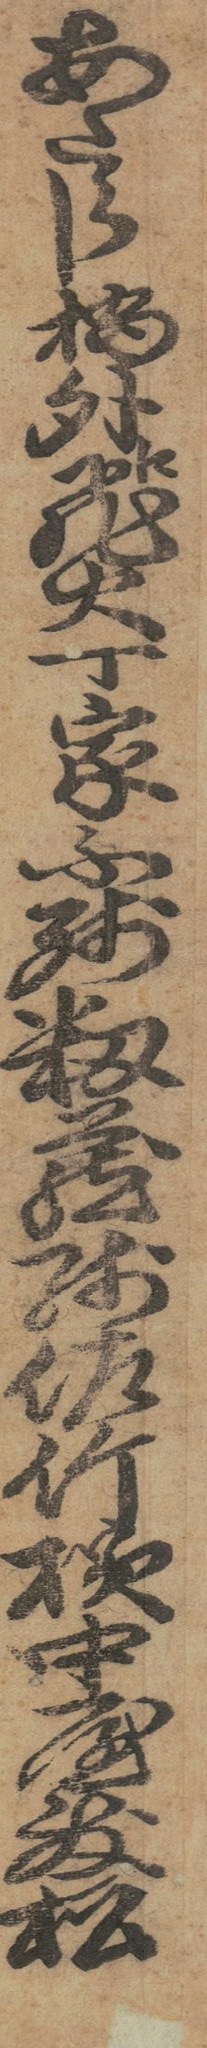あたらし橋外江飛火丁家不残籾蔵残佐竹様中屋敷松
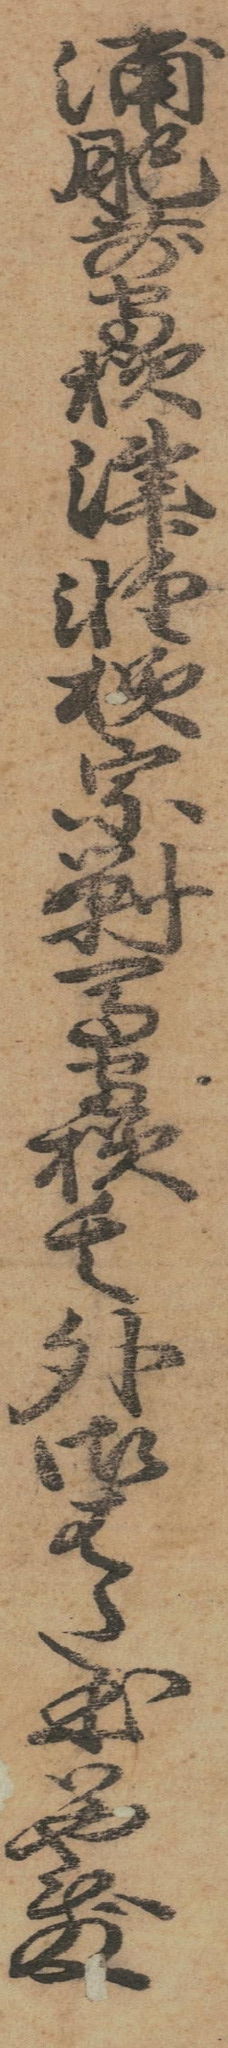浦肥前守様津軽様宗対馬守様其外御はた本御や敷
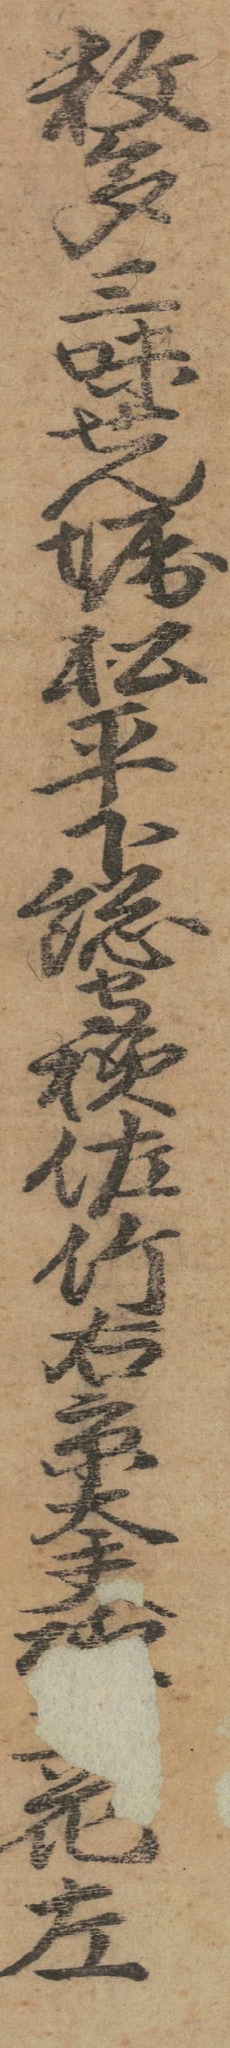数多三味せん堀松平下総守様佐竹右京大夫様立花左
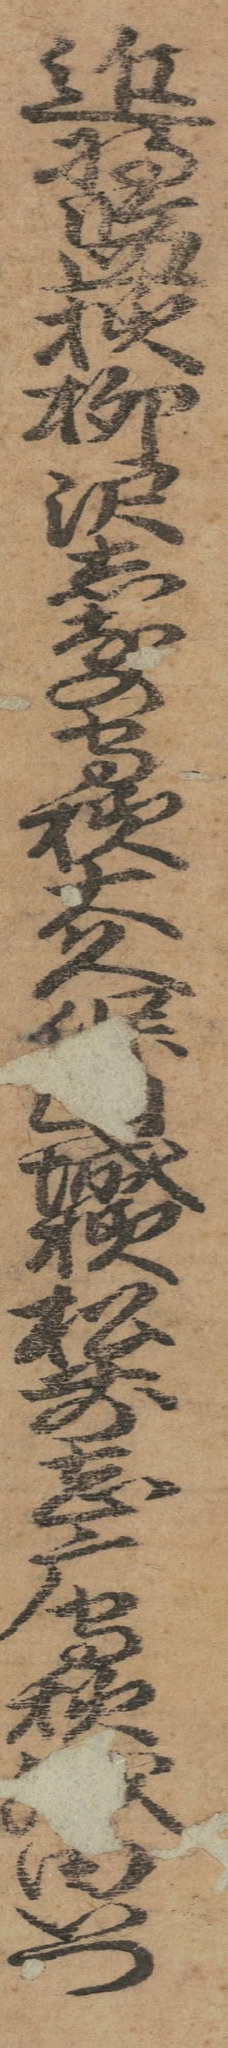近将監様柳沢しなの守様大久保山城様松前志摩守様沢田いつ
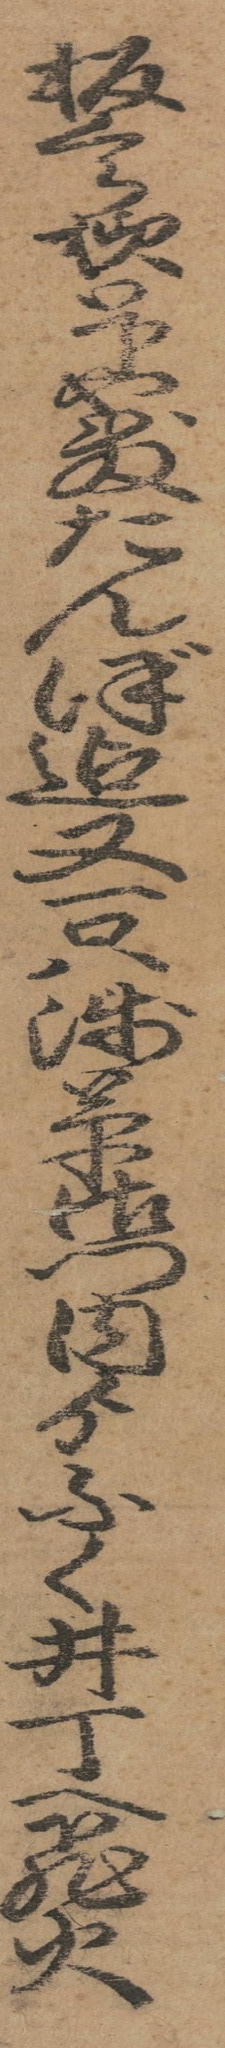板くら様御下や敷たんぼ迄又一口ハ浅草御門内ゟふく井丁へ飛火
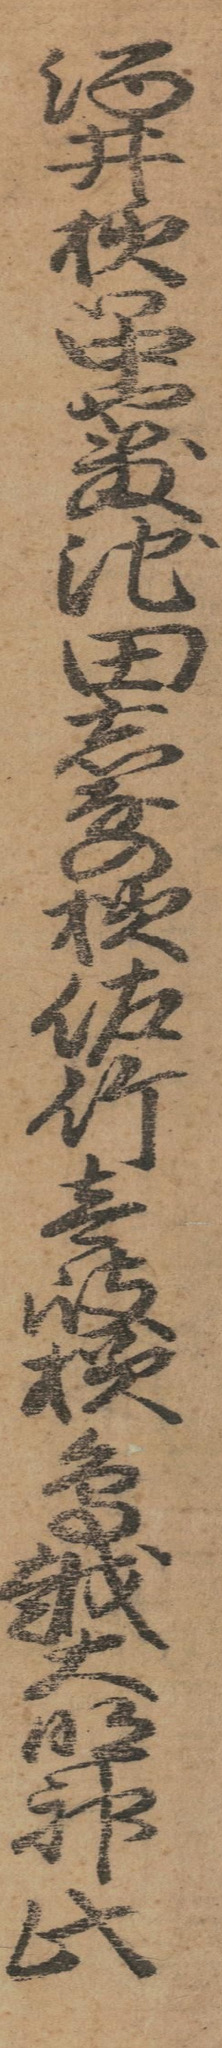酒井様御中や敷池田しなの様無佐竹壱岐様鳥越大明神此
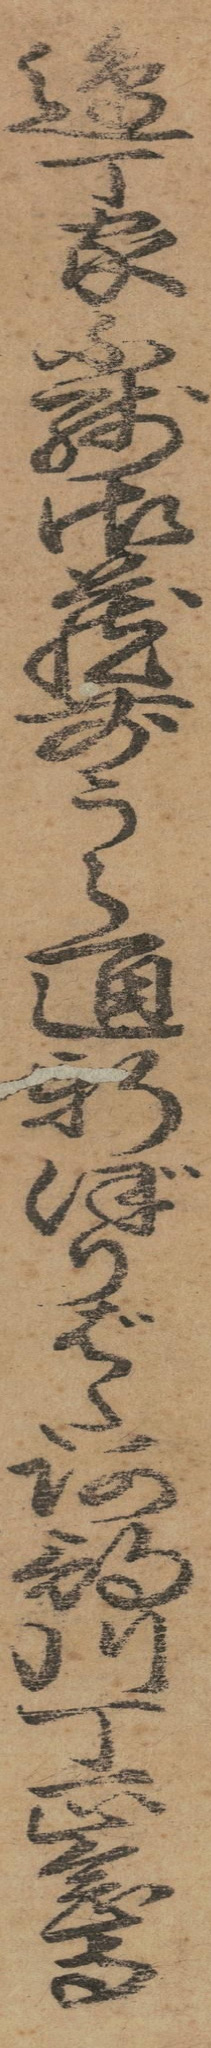邊丁家不残御蔵前うら通新ぼりばた阿部川丁正念寺
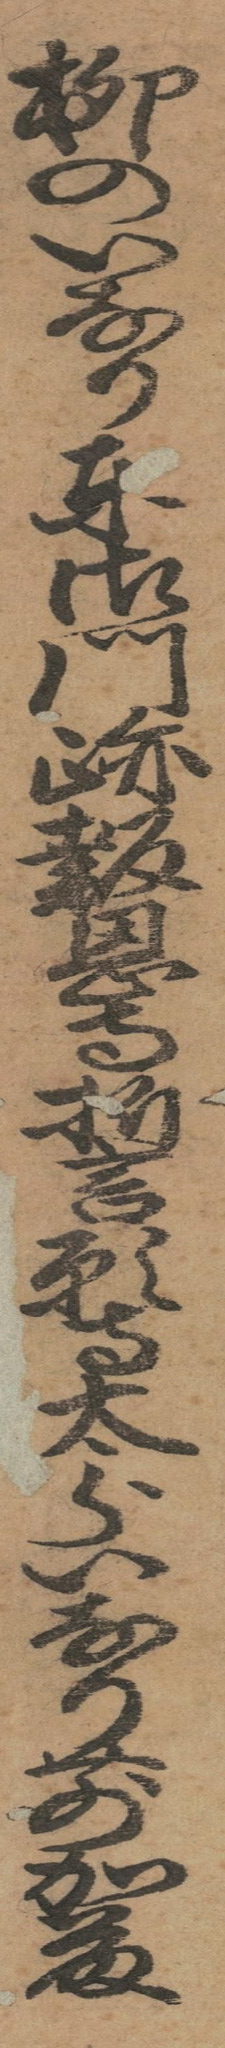柳のいなり東御門跡報恩寺誓願寺太らいなり前加藤
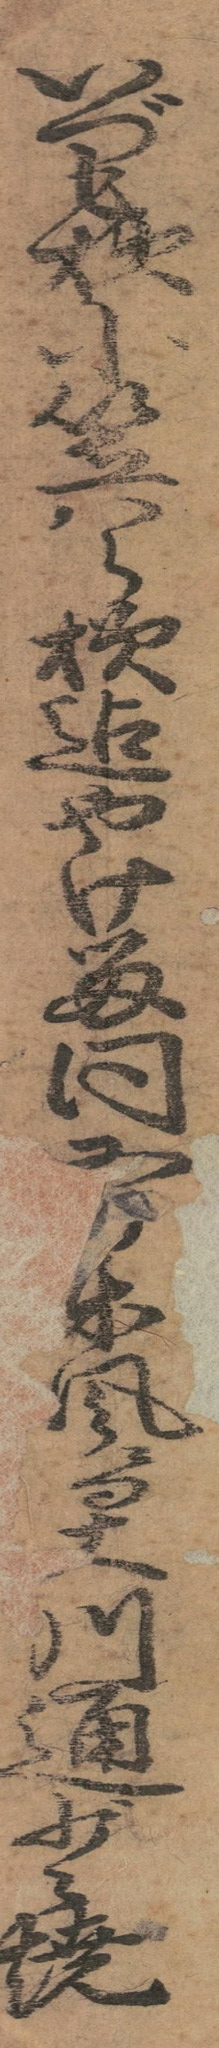いづも様小笠ハら様迄やける同五月東風ニ而大川通少々焼
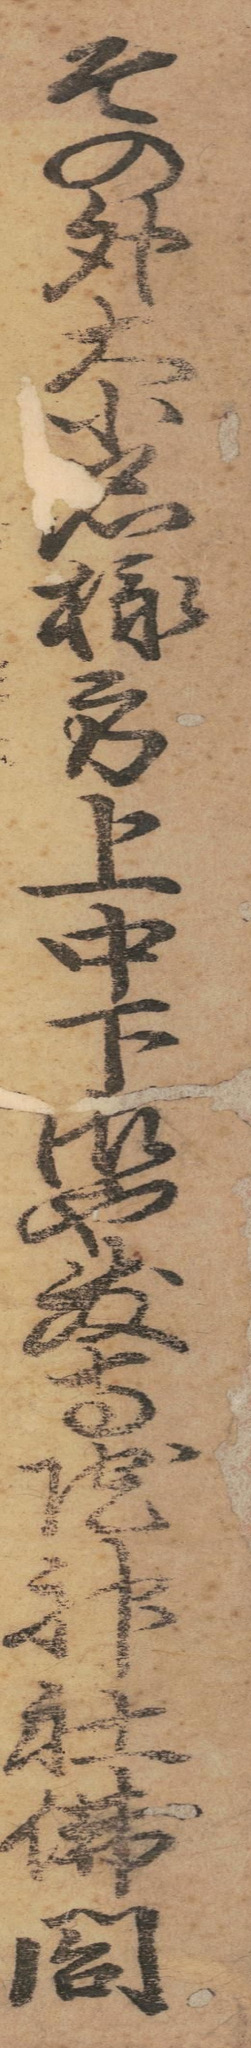その外大小名様方上中下御や敷寺院神社仏閣
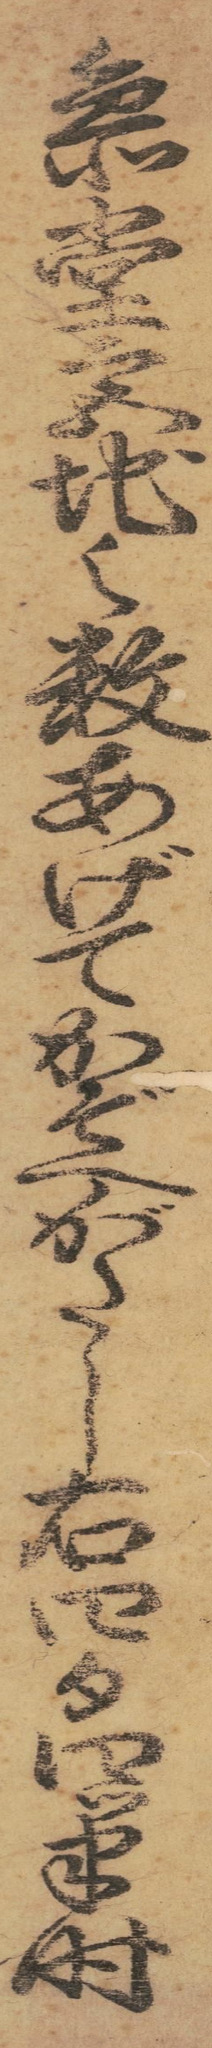参堂宮地之数あげてかぞへがたし右四日四ッ半時
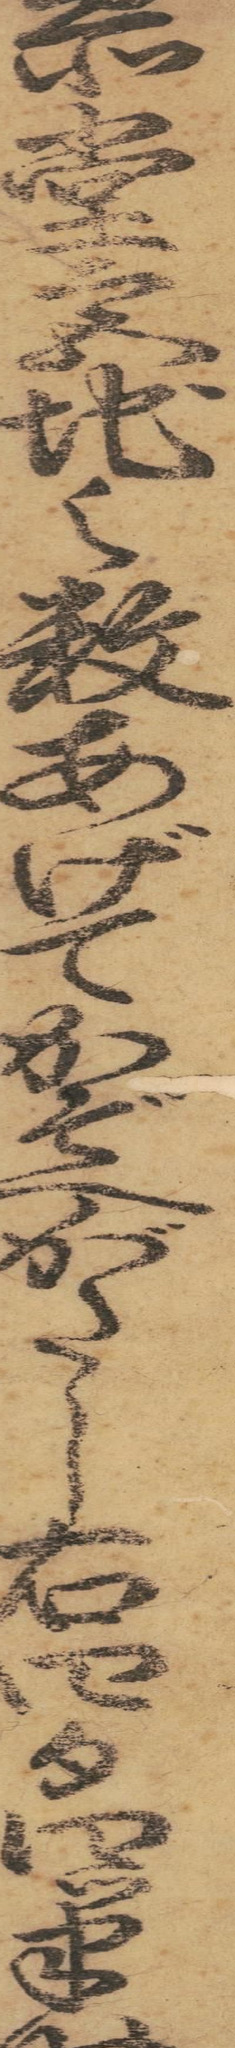参堂宮地之数あげてかぞへがたし右四日四ッ半時
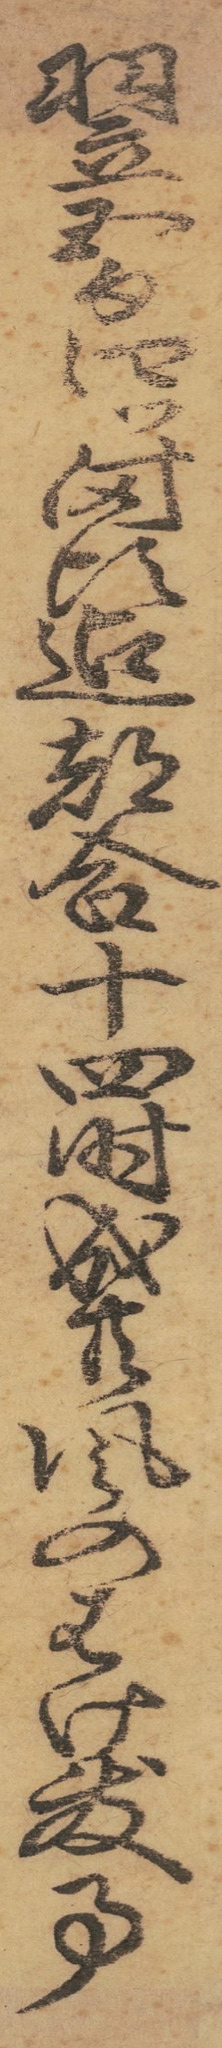翌五日四ッ時頃迄都合十四時成共風のはげ敷事
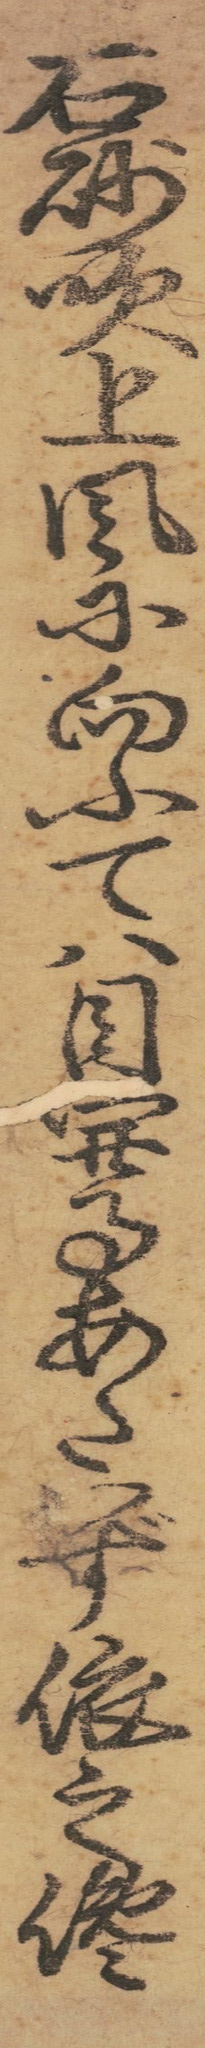石砂吹上風に向ふてハ目開事あたハず依之纔
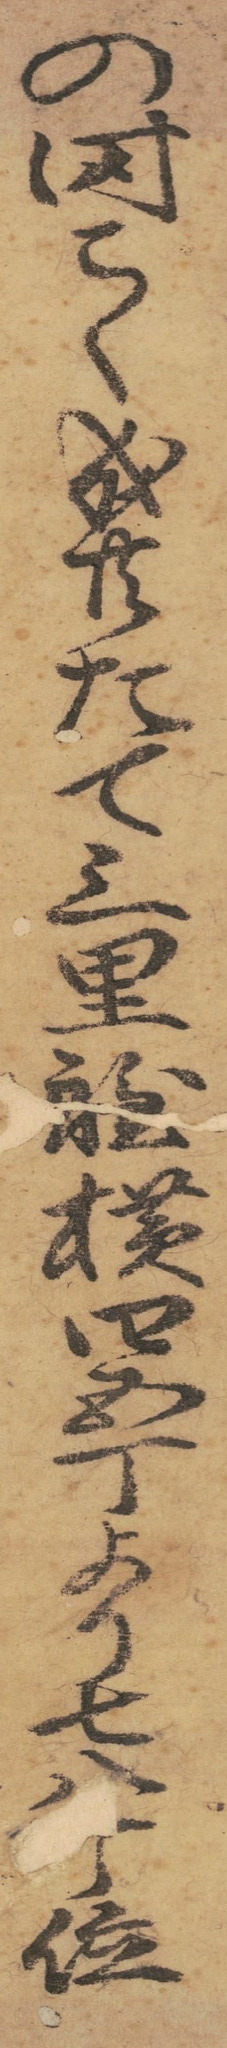の時こく成共たて三里程横四五丁より七八丁位
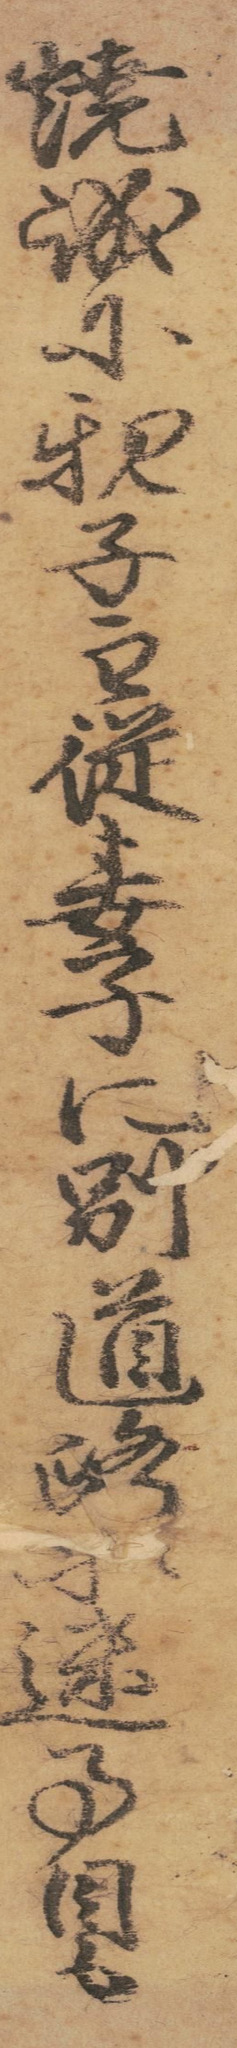焼誠に親子主従妻子に別道路ニ於迷事目も
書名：出火方角場所附
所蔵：東京大学地震研究所図書室 Earthquake Research Institute Library, The University of Tokyo, JAPAN
